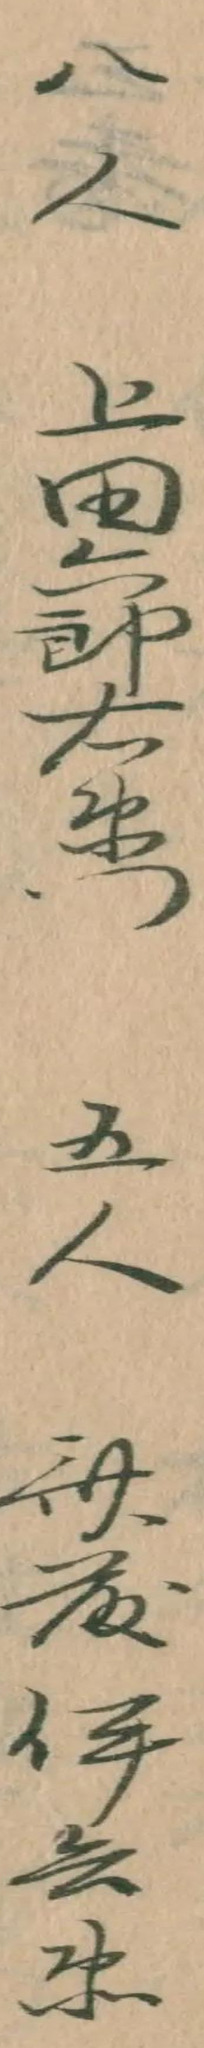八人上田六郎右衛門五人斎藤伊兵衛
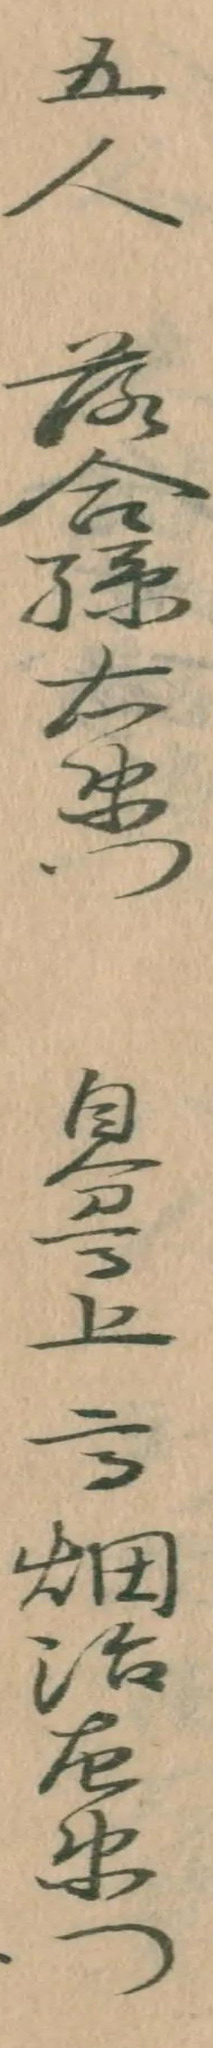五人落合孫右衛門自分馬上高畑治左衛門
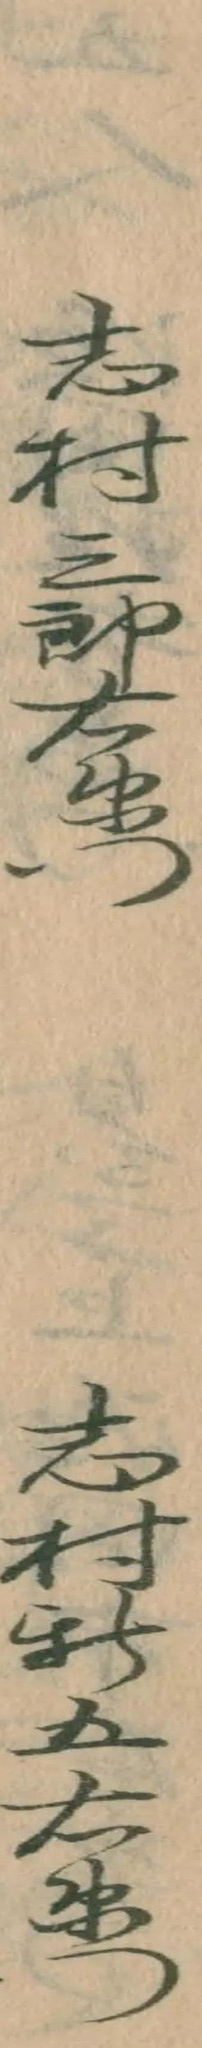志村三郎右衛門志村新五右衛門
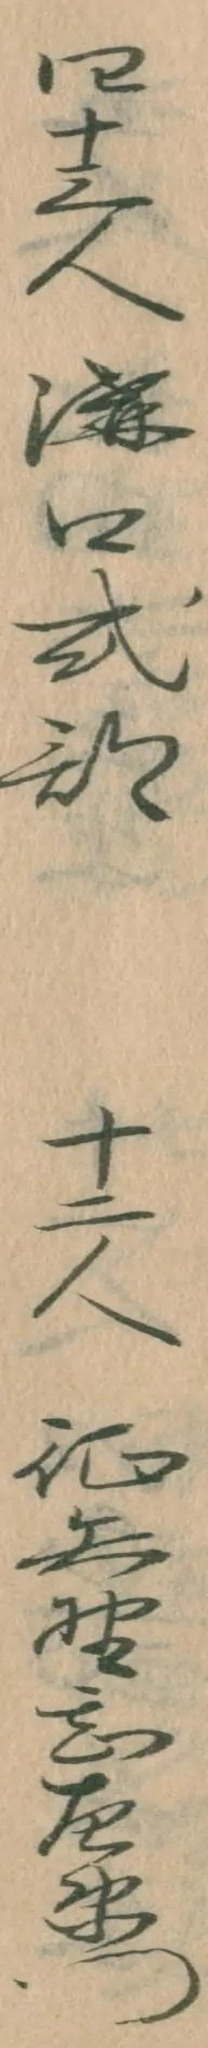四十三人溝口式部十二人征矢野甚左衛門
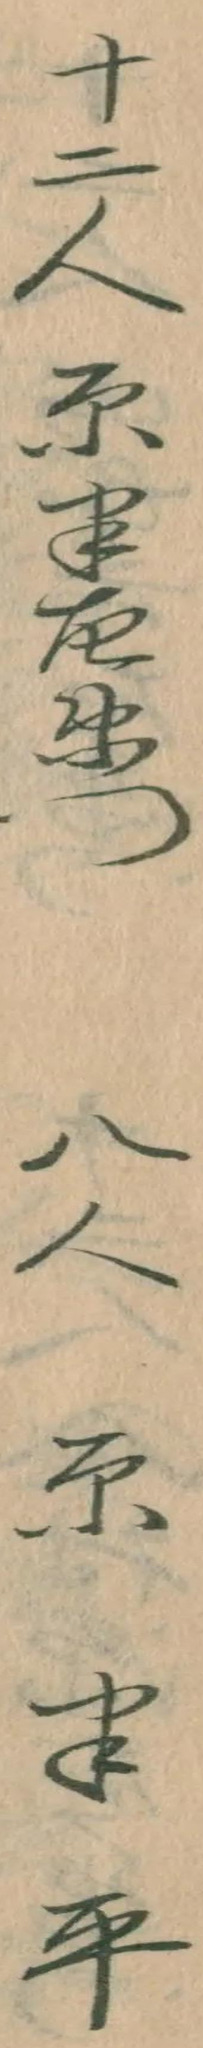十二人原半左衛門八人原半平
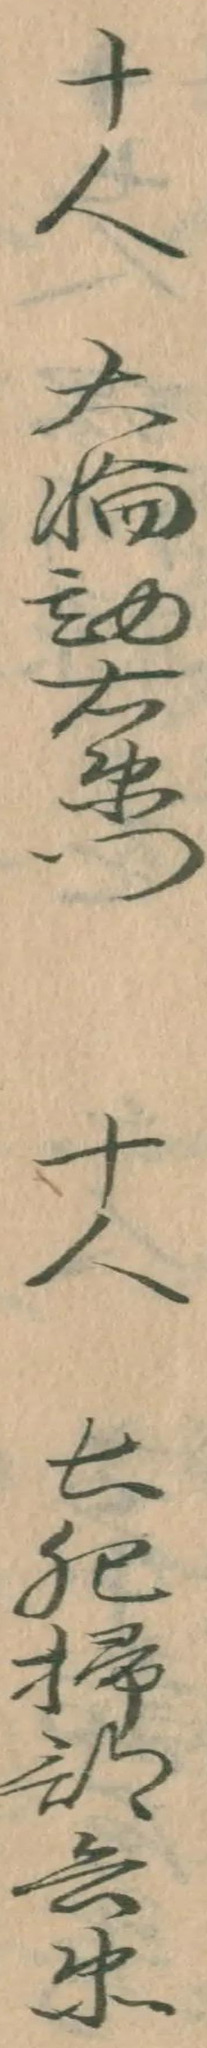十人大輪勘右衛門十人土肥掃部兵衛
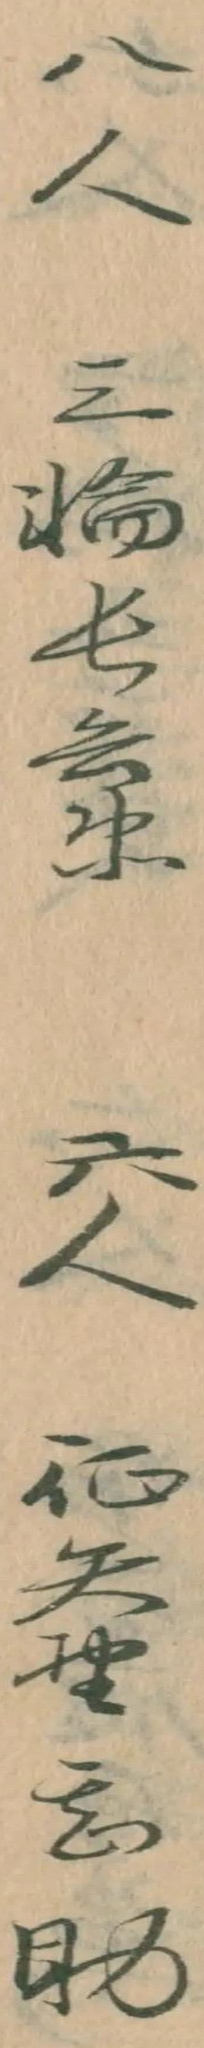八人三輪長兵衛六人征矢野甚助

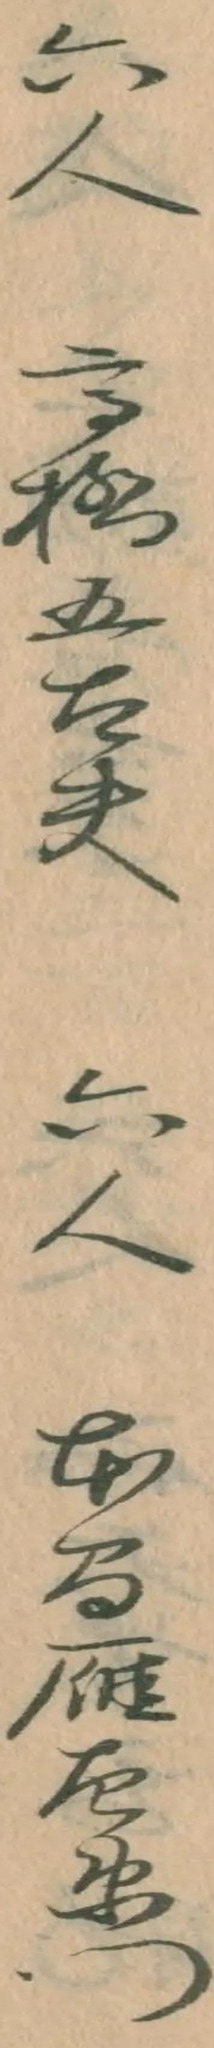六人高橋五太夫六人本間雁左衛門
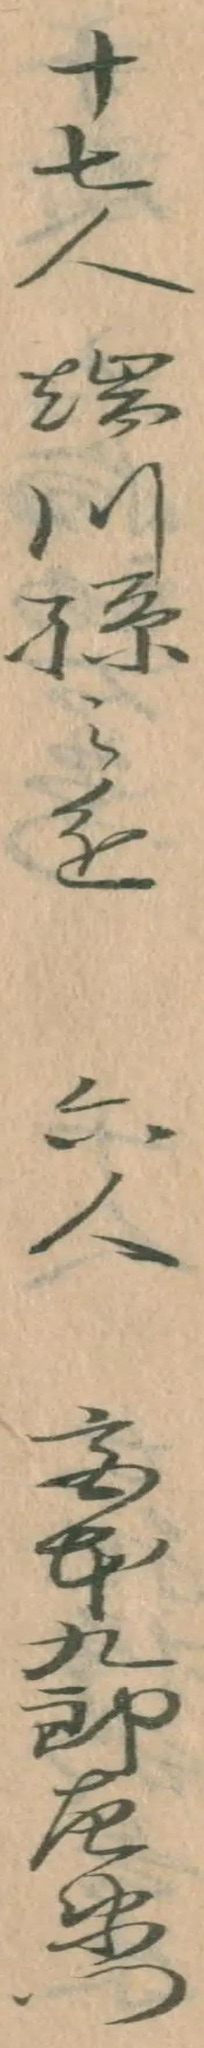十七人瑞川孫之進六人宮本九郎左衛門
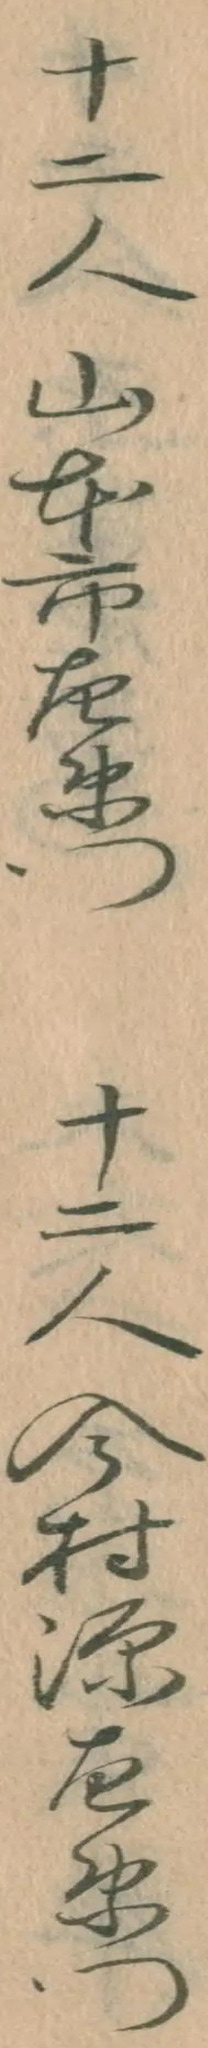十二人山本市左衛門十二人今村源左衛門
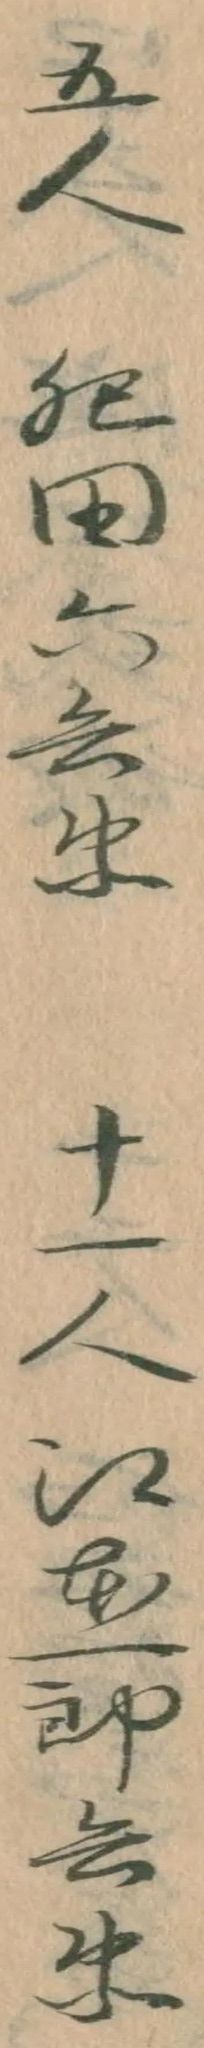五人肥田六兵衛十一人江本一郎兵衛
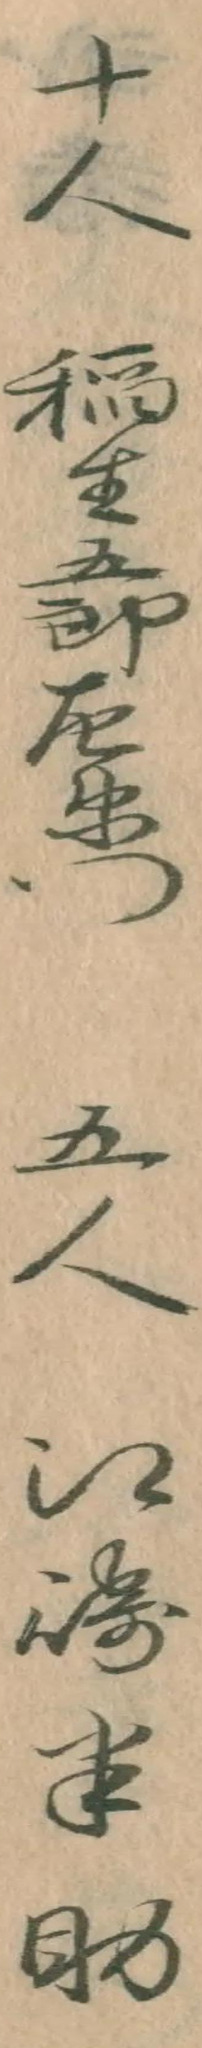十人稲生五郎左衛門五人江崎半助
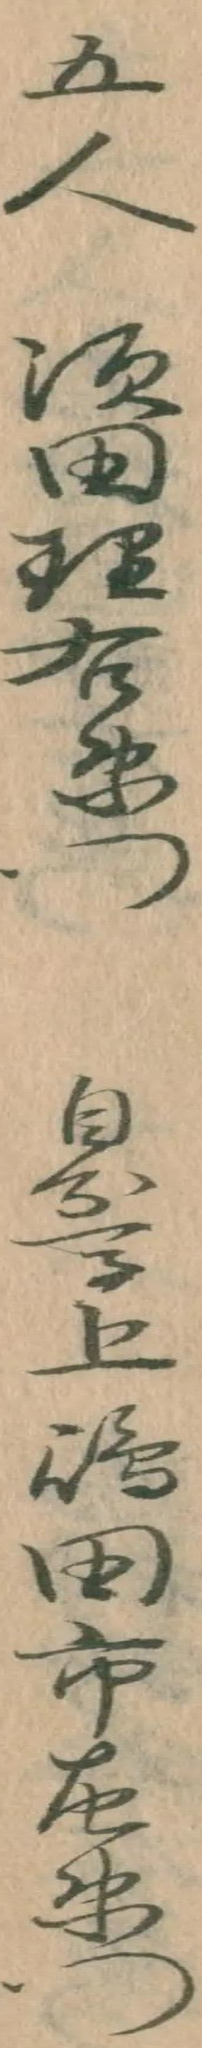五人須田理右衛門自分馬上島田市左衛門
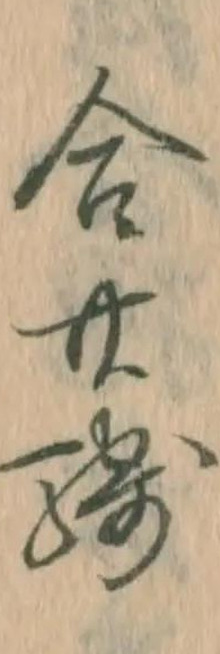合廿騎
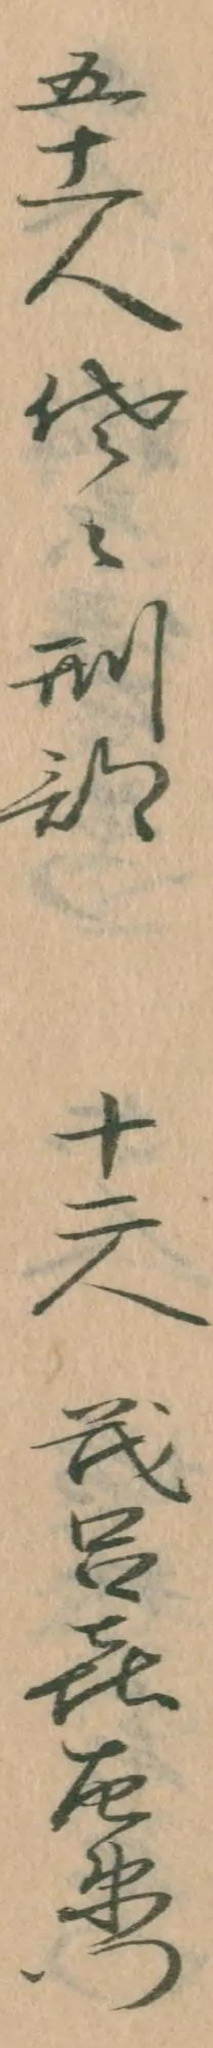五十一人佐々刑部十二人茂呂喜左衛門
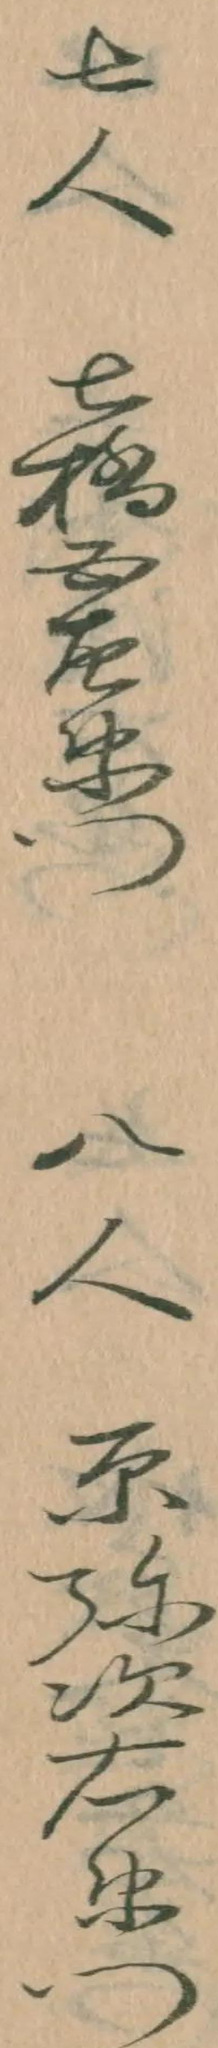七人七橋五左衛門八人原弥次右衛門
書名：切支丹御退治記 49巻. [6]
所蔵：国立国会図書館 National Diet Library, JAPAN
